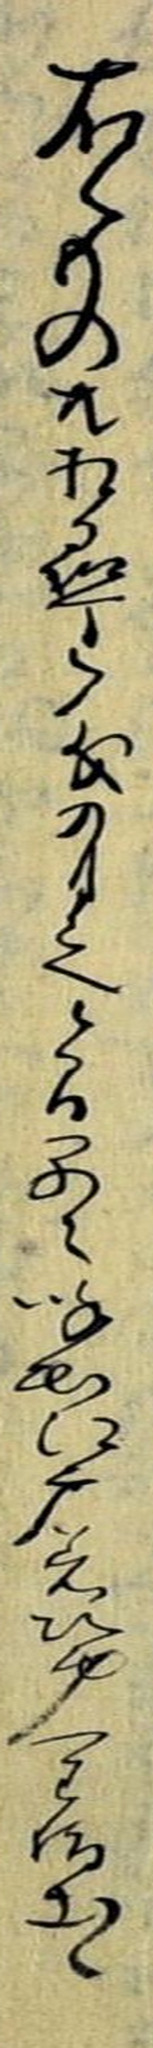右之もの共尋之義有之候間早々呼出江戸着次第可被指出候
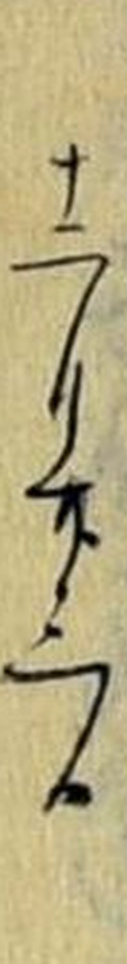十二月廿二日
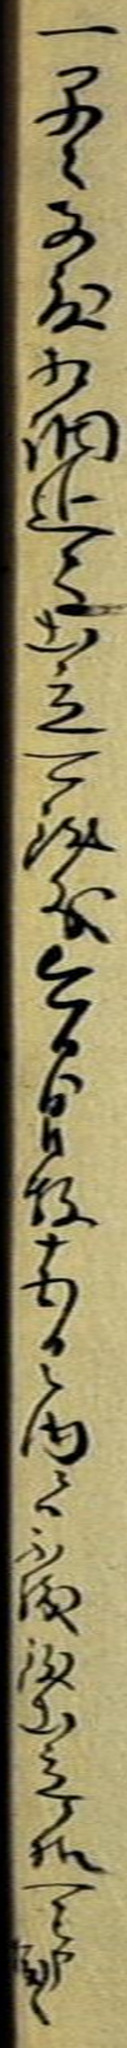一早々支度相調追々出立可致義今日ゟ日数十五日には不残致出立候様可被申渡之
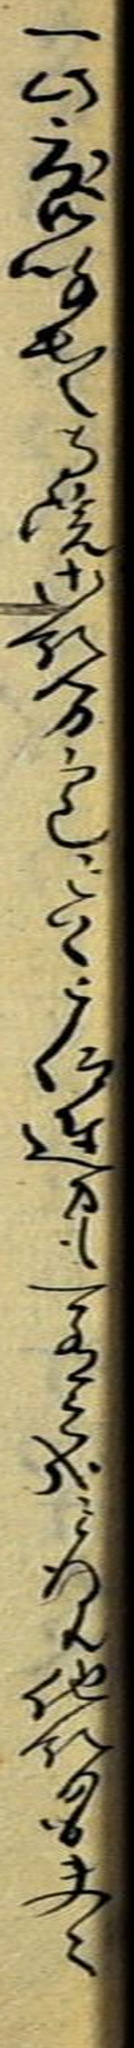一此度御呼出之寺院御領分而巳に候はヽ被仰達方も可有之哉に候得共他領ゟも夫々
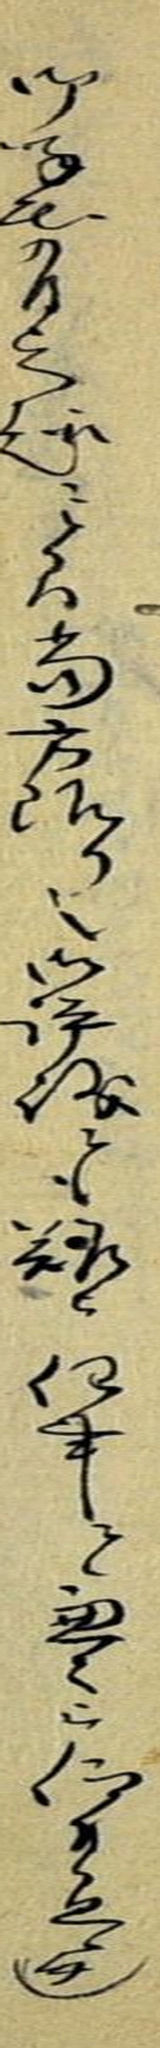御呼出有之趣候間当方限り之御評議にも難被任事に候兼而被仰付置候通
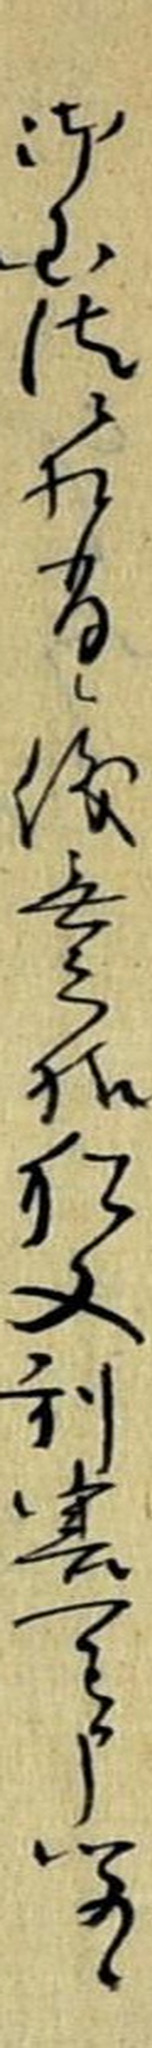御国法に相背候儀無之様猶又利害可申聞候
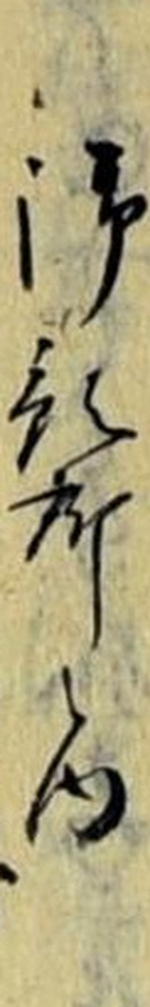御預所之内
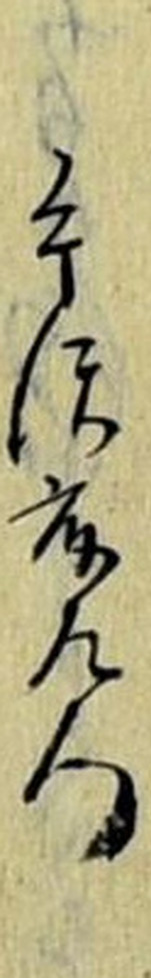寺沢藤左衛門
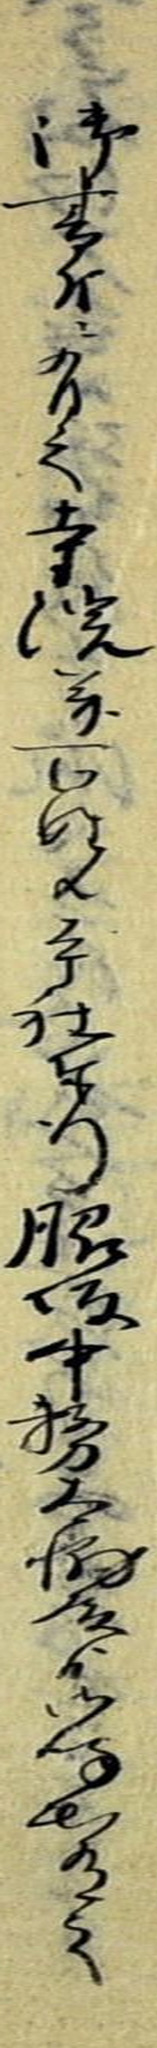御書付に有之寺院并百姓共寺社奉行脇坂中務太輔殿ゟ御呼出有之
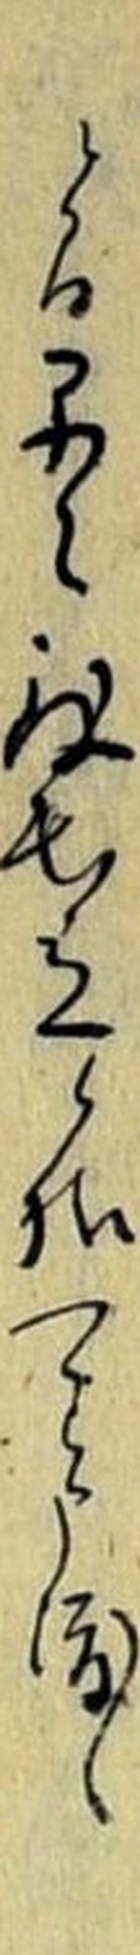候間早々致出立候様可被申渡候
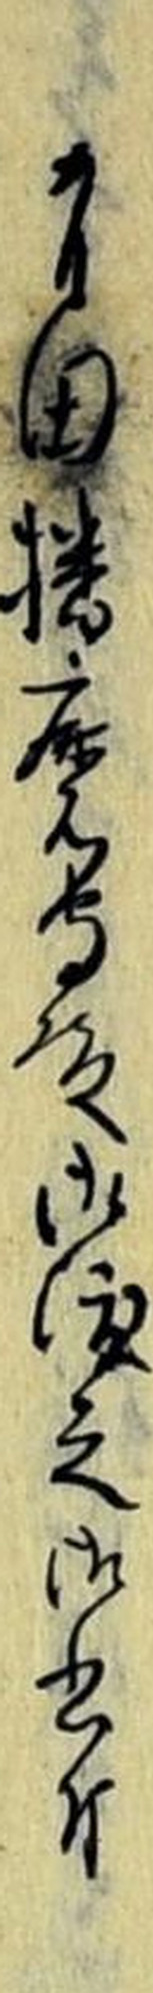有田播磨守殿御渡之御書付
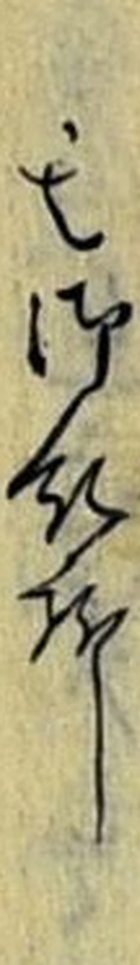其御領所
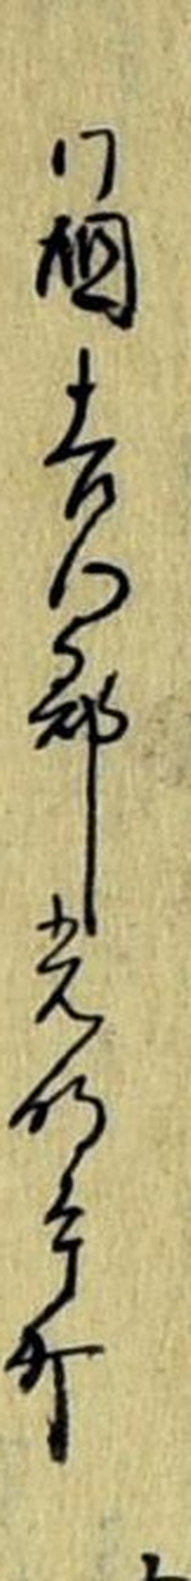同国吉田郡光明寺村

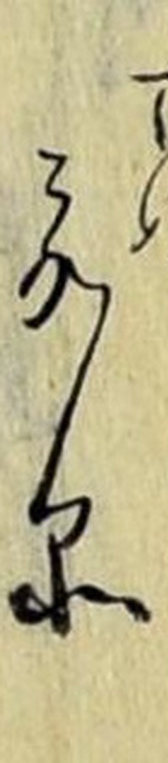嘉兵衛
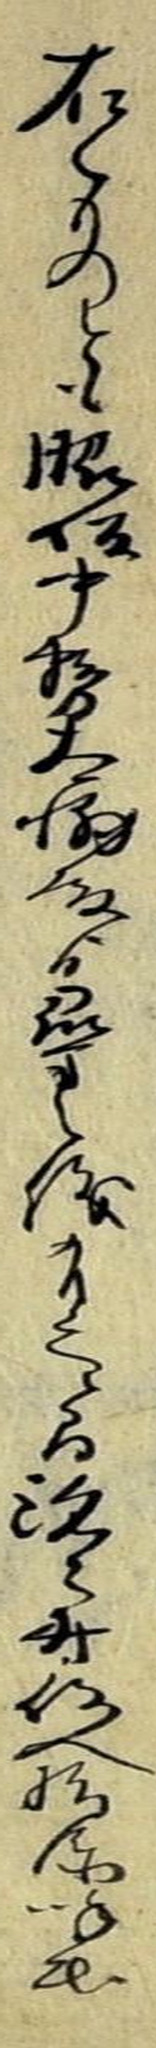右之ものとも脇坂中務太輔殿ゟ尋之儀有之候間銘々村役人指添呼出
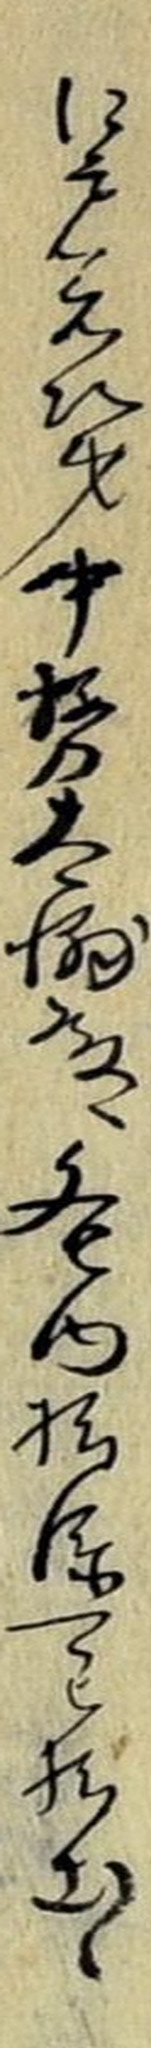江戸着次第中務太輔殿へ各内指添可被指出候
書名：命令之部 四
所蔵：福井県文書館 Fukui Prefectural Archives
